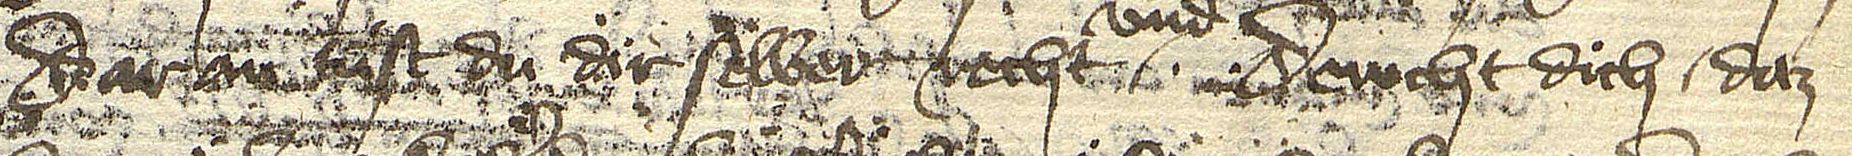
Daran tüſt du dir ſelber recht / . Dewcht dich / daʒ
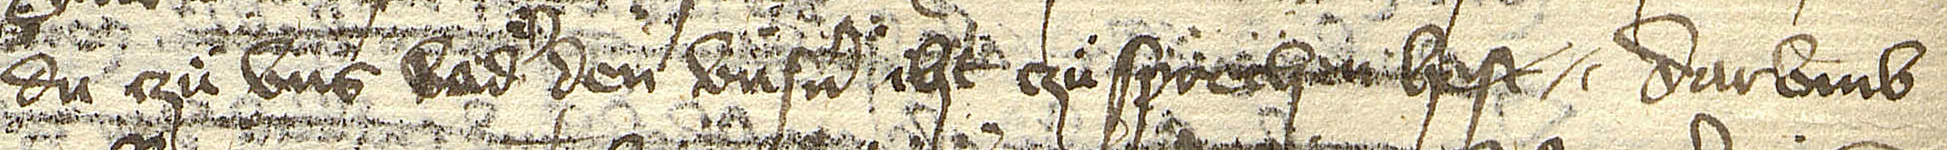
du cʒü vns od* den vnſn* iht cʒü ſprechen heſt / . Darvmb
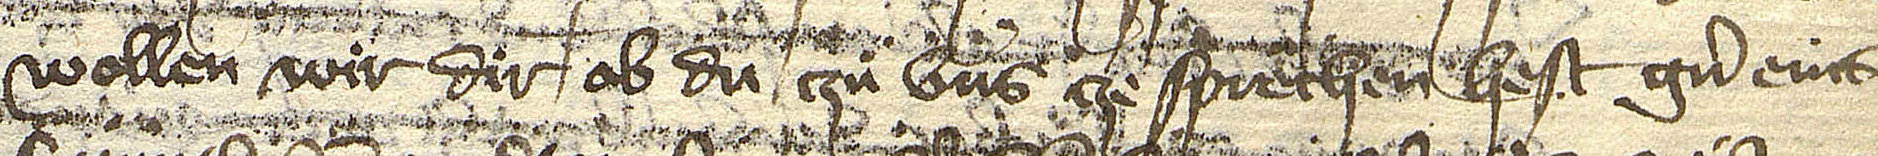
wollen wir dir ob du cʒü vns cʒe ſprechen heſt gn* eins
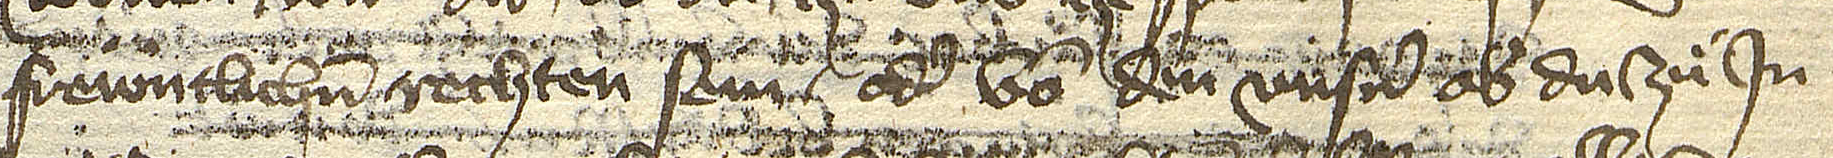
frewntlichn* rechten ſein / od* vo* den vnſn* ob du cʒü In
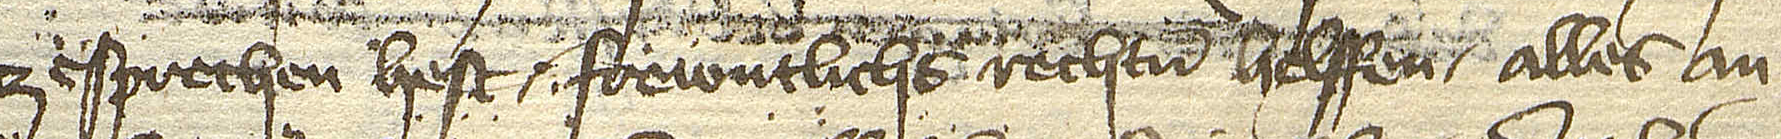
cʒeſprechen heſt / frewntlichs rechtn* helffen / alles an
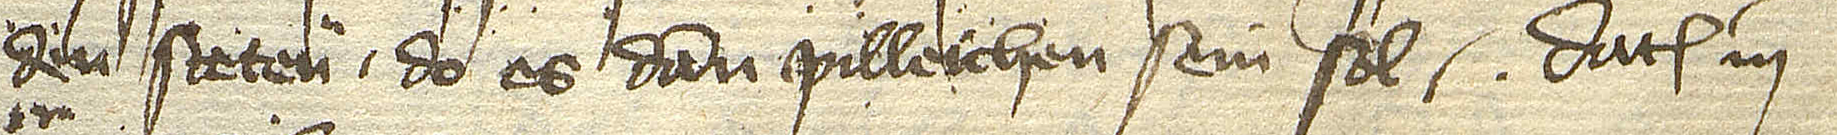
den ſteten / do es da*n pilleichen ſein ſol / . Dat* in
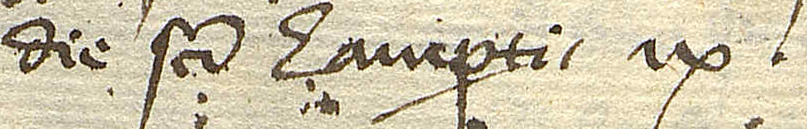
die ſci* Lamp*ti / ix .
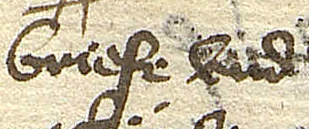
briefe vnd
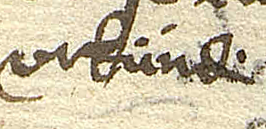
vrkünde
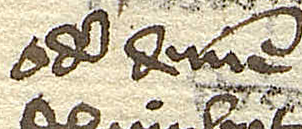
od* deine*
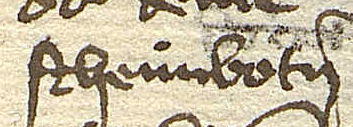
ſcheimbotn*
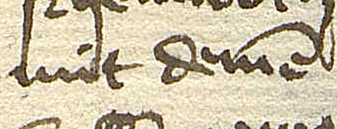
mit deine*
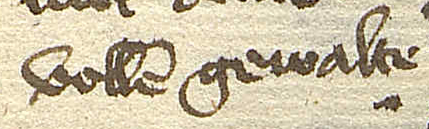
volle* gewalte
